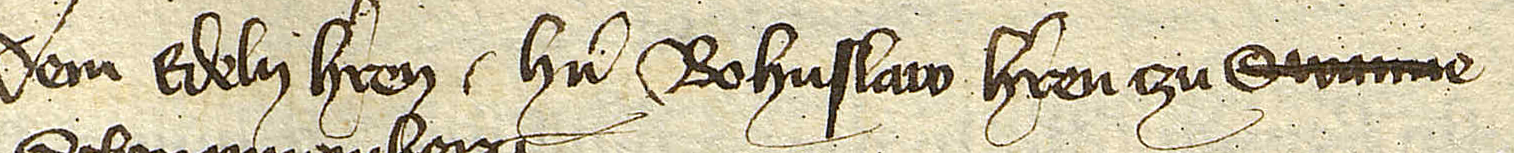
Dem Edeln h*ren / hn* Bohuſlaw h*ren cʒu Swanne
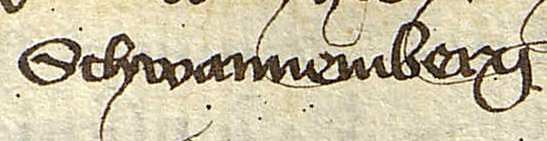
Schwannemberg
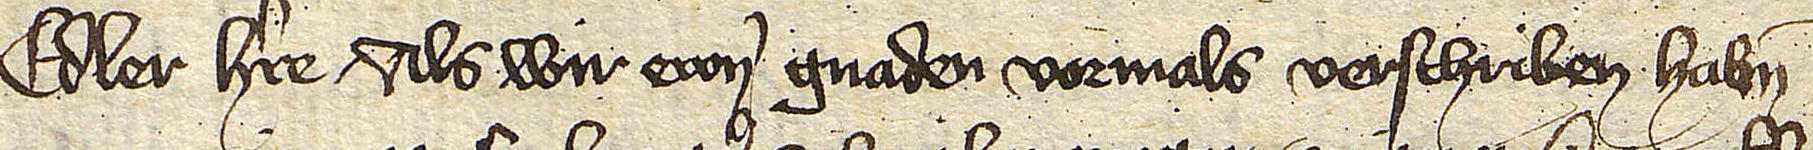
Edler h*re / Als wir ewn* gnaden vormals verſchriben habn*
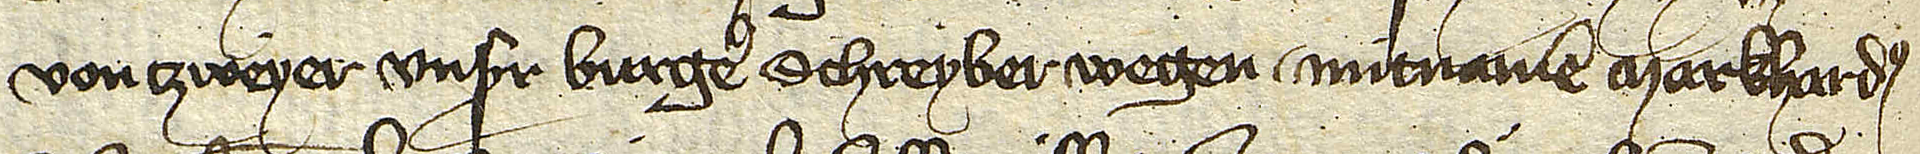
vnd cʒweyer vnſ*r burge* Schreyber wegen / mitname* Markhard*
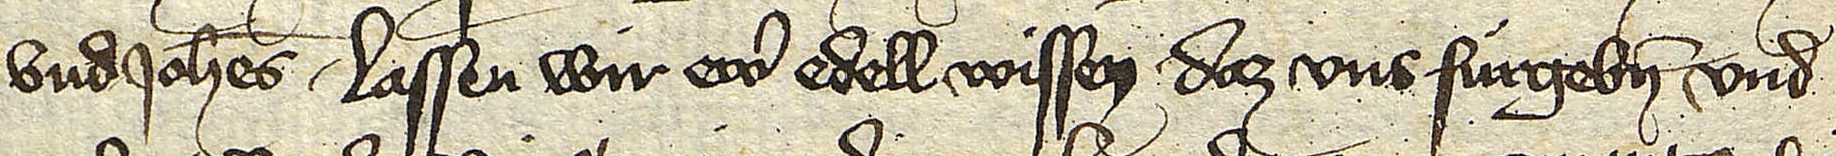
vnd Iohes* / Laſſen wir ew* edell wiſſen / daʒ vns fürgebn* vnd
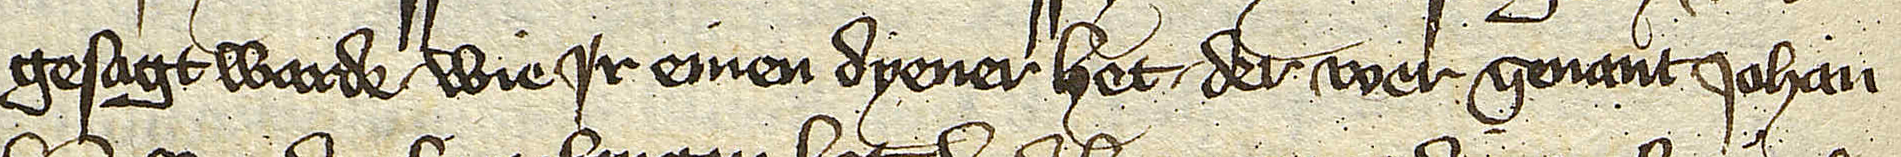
geſagt warde / wie Ir einen dyener het / der wer genant Iohan
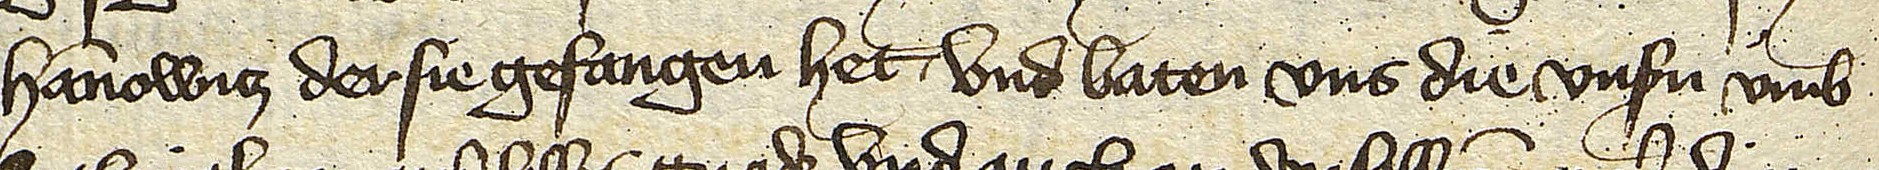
hanowicʒ* der ſie gefangen het / vnd baten vns die vnſ*n v̈mb
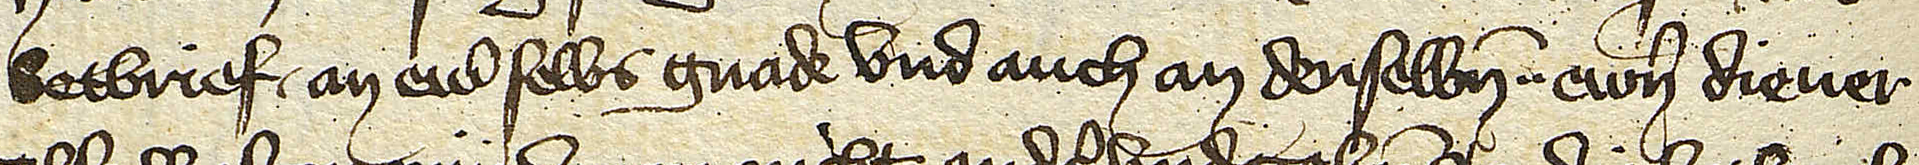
betbrief / an ew* ſelbs gnade vnd auch an denſelbn* ~ ewn* diener
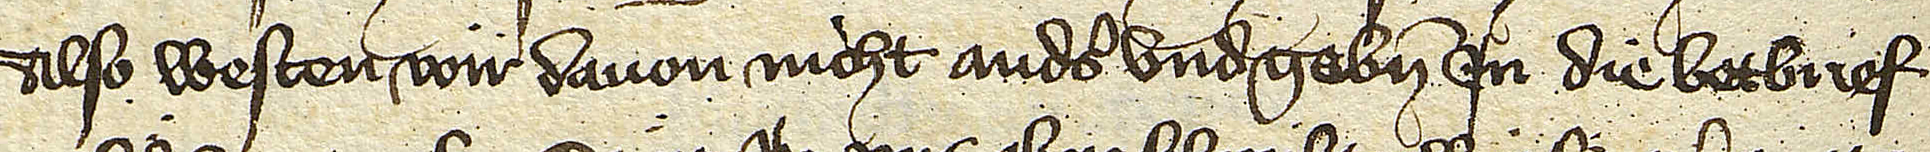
Alſo weſten wir dauon nicht ands* vnd gabn* In die betbrief
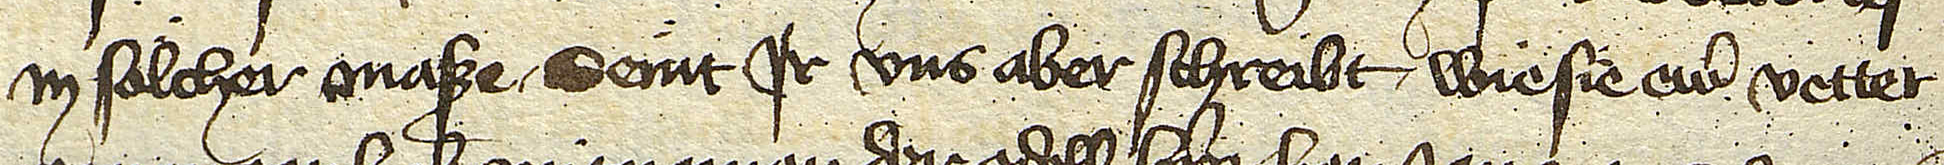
in ſölicher maſʒe / Seint Ir vns aber ſchreibt / wie ſie ew* vetter
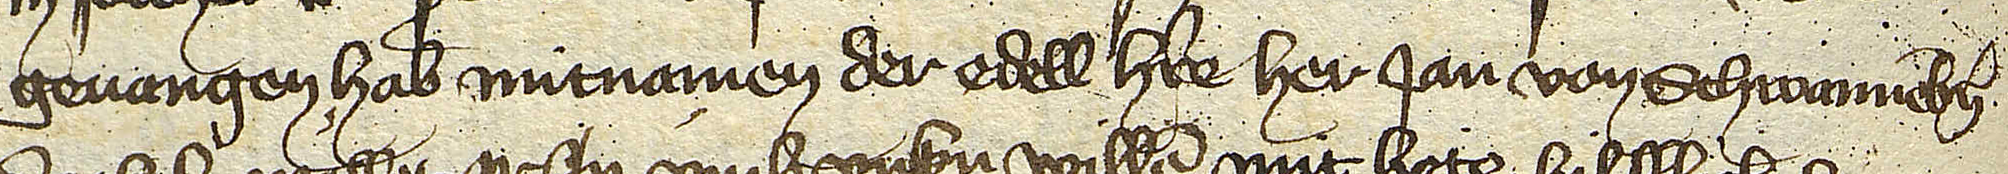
geuangen hab mitnamen der edell h*re her Ian von Schwanne*bg*
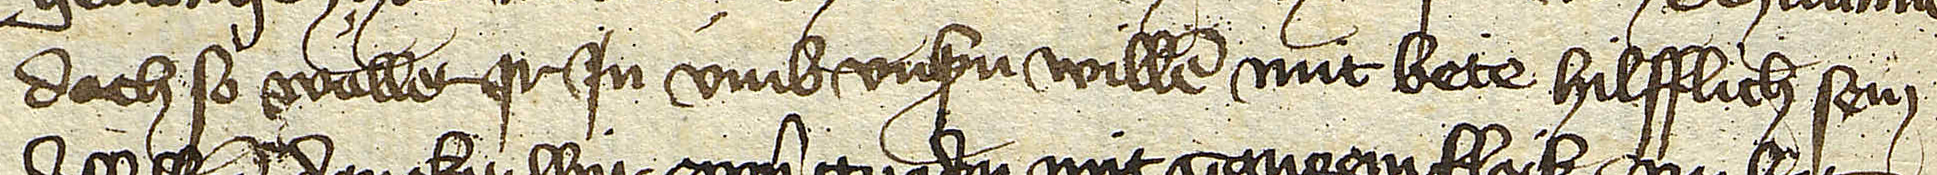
doch ſo wöllet Ir In vmb vnſ*n wille* mit bete hilfflich ſein
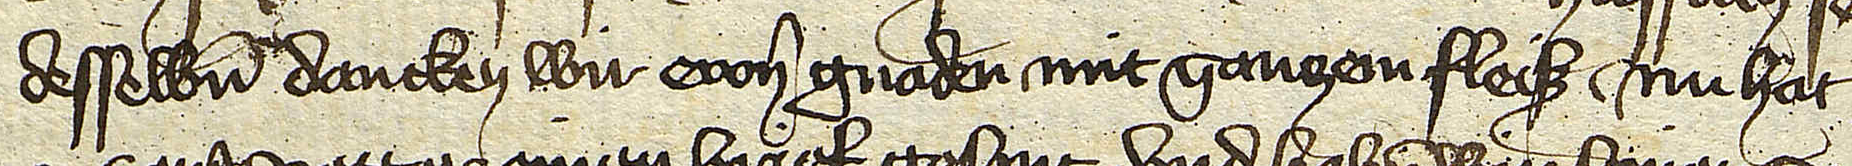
deſſelbn* dancken wir ewn* gnaden mit gancʒem fleiſʒ / Nu hat
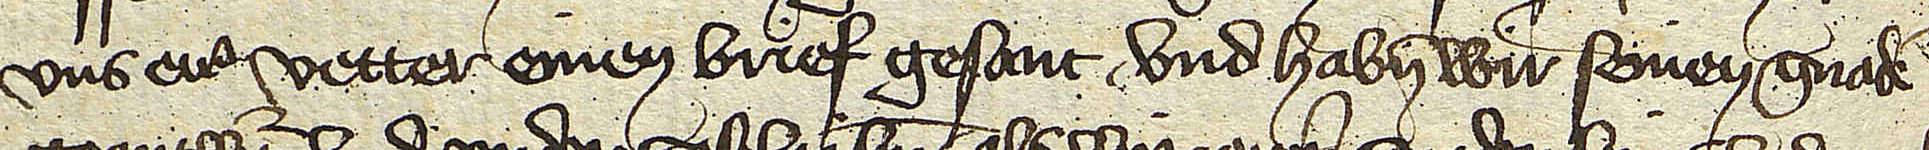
vns ew* vetter einen brief geſant / vnd habn* wir ſeinen gnade*
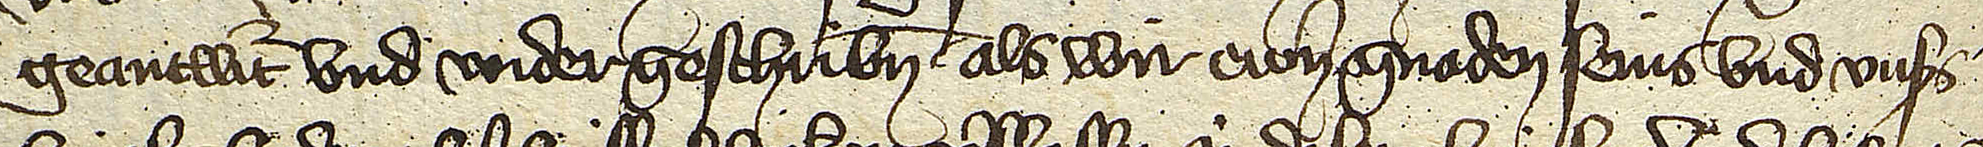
geantwt* vnd vndergeſchribn* / als wir ewn* gnaden ſeins vnd vnſ*s
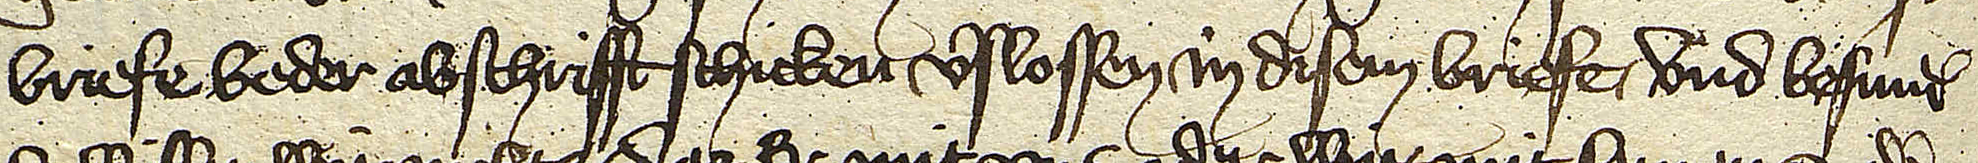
briefe beder abſchrifft ſchicken v*ſloſſen in diſem briefe / vnd beſund*
